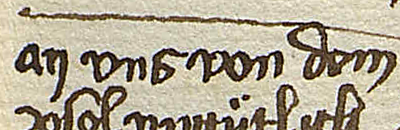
an vns von dem
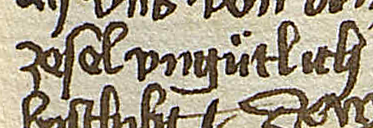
ʒeſel vngütlich
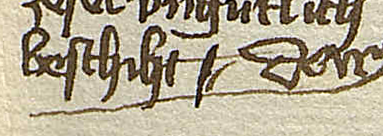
beſchiht / Dar
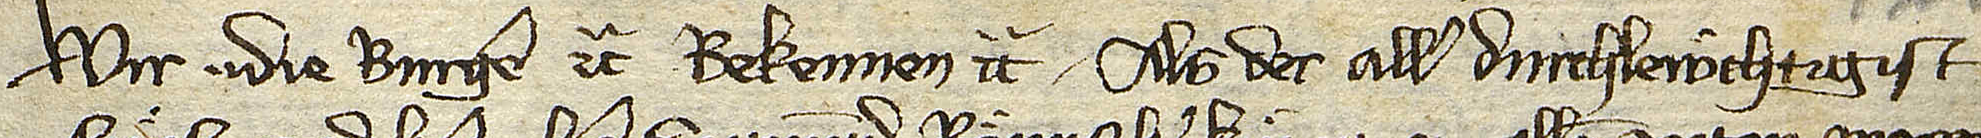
Wir ~ die Burge* ec* / Bekennen ec* / Als der all* durchlewchtigiſt
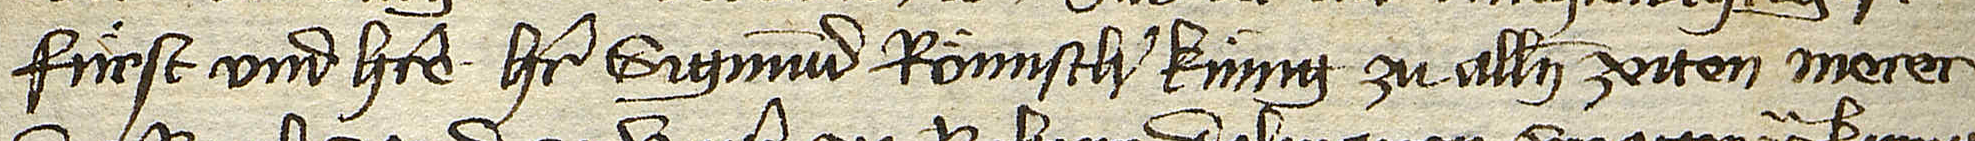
fürſt vnd h*re . hr* Sigmu*d Römiſch* künig cʒu alln* ʒeiten merer
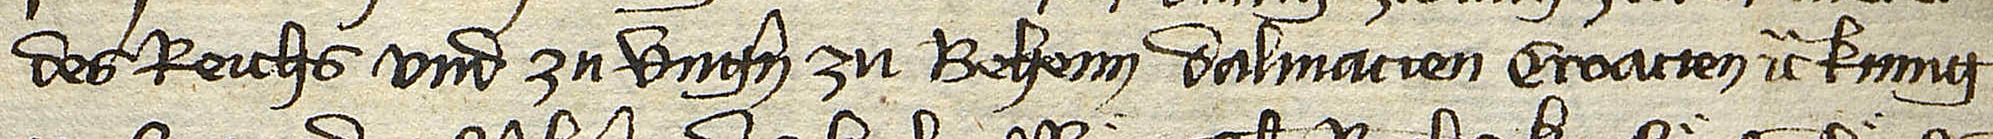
des Reichs vnd ʒu Vng*n ʒu Beheim dalmacien Croacien ec* kunig
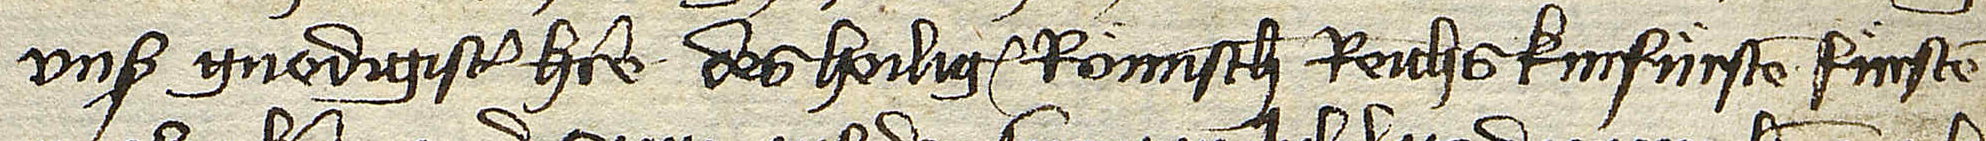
vnſ* gnedigiſt* h*r e. des heilig* Römiſch* Reichs kurfürſte* fürſte*
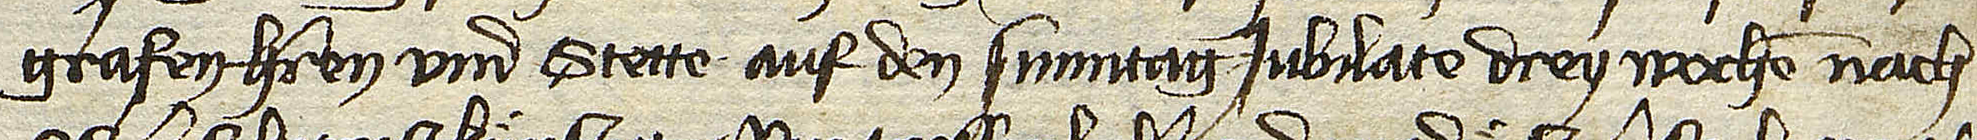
grafen h*ren vnd Stette . auf den ſunntag Iubilate drey woche* nach
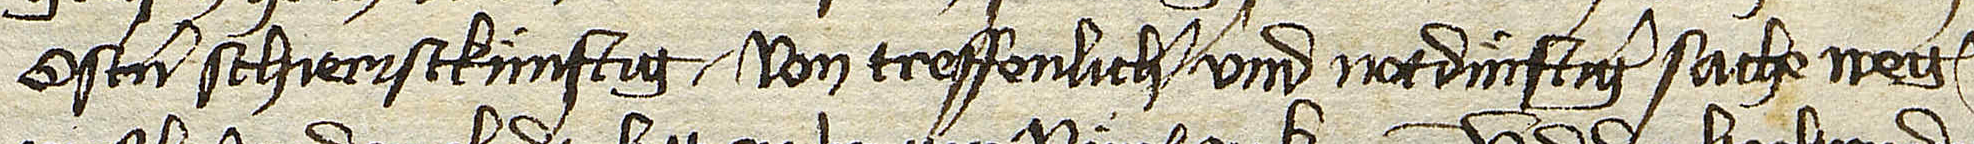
Oſt*n ſchieriſtkünftig / Von treffenlich* vnd notdürftig* ſache weg*
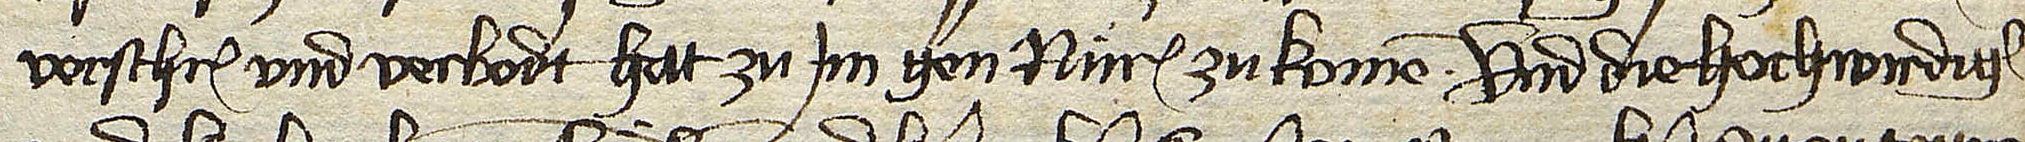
verſchr* vnd verbodt hat ʒu Im gen Nür* ʒu kome* . Vnd die hochwirdig*
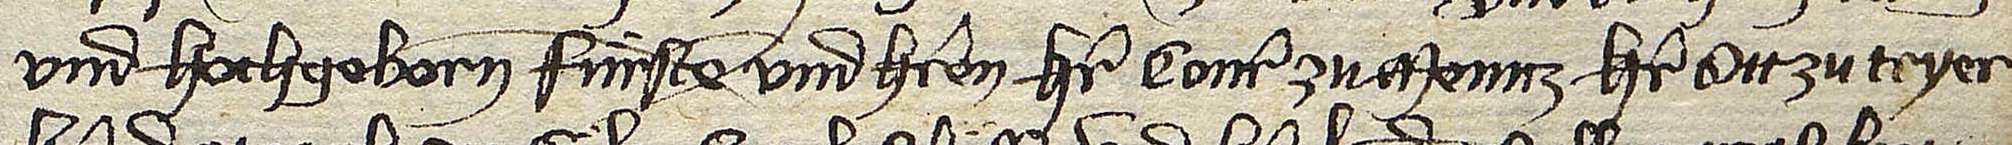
vnd hochgeborn* fürſte* vnd h*ren hr* Conr* ʒu Meincʒ hr* Ott ʒu tryer
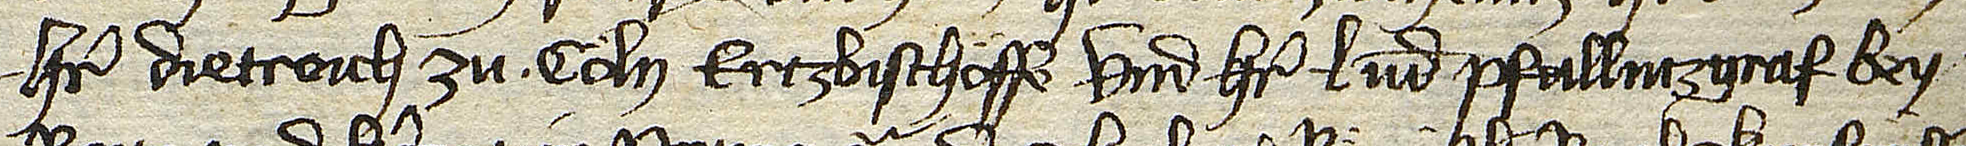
hr* dietreich ʒu . Cöln Ercʒbiſchöffe Vnd hr* lud* pfallncʒgraf bey
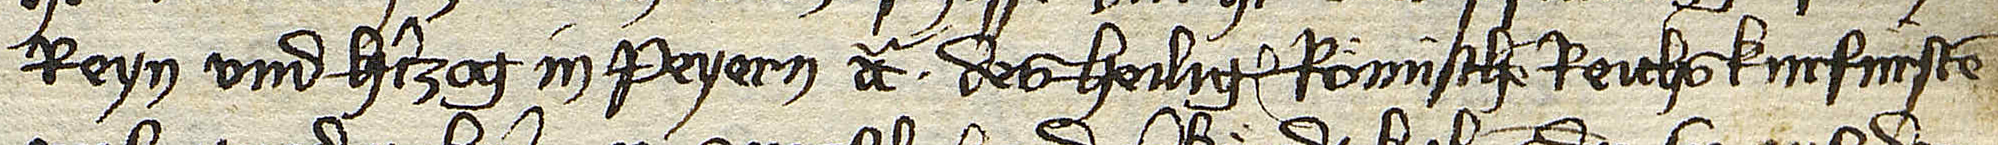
Reyn vnd h*cʒog in Peyern ec* . des heilig* Römiſche* Reichs kurfürſte*
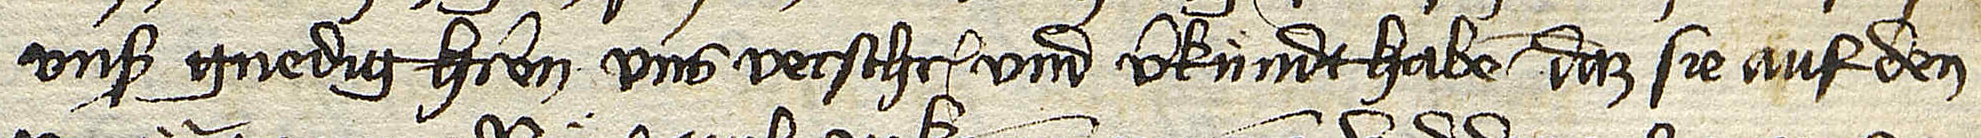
vnſ* gnedig h*ren vns verſchr* vnd v*kündt habe* / daʒ ſie auf den
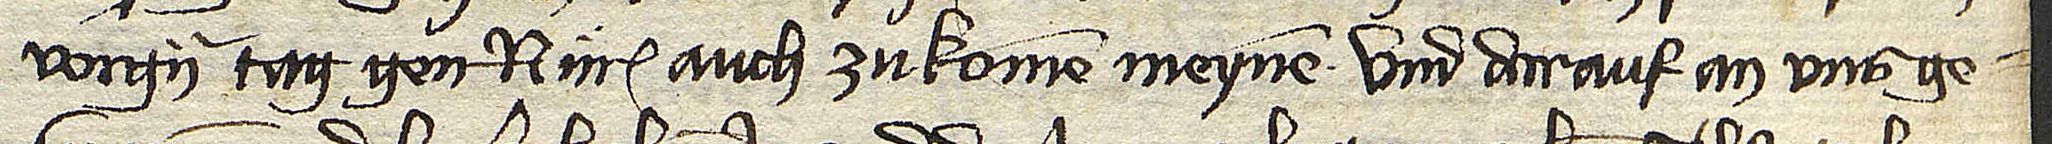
vorgn* tag gen Nür* auch zu kome* meyne* vnd darauf an vns ge =
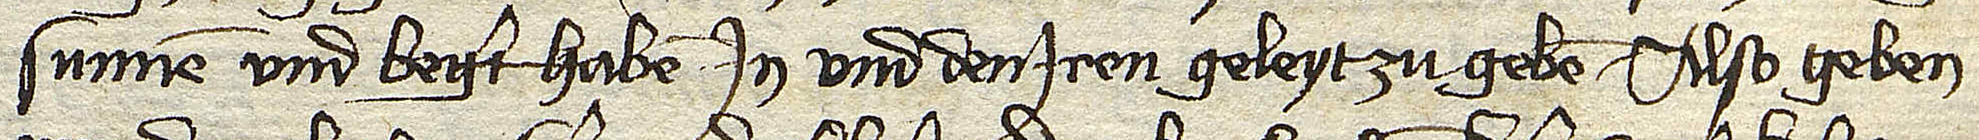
ſunne* vnd beg*t habe* . In vnd den Iren geleyt ʒu gebe* / Alſo geben
